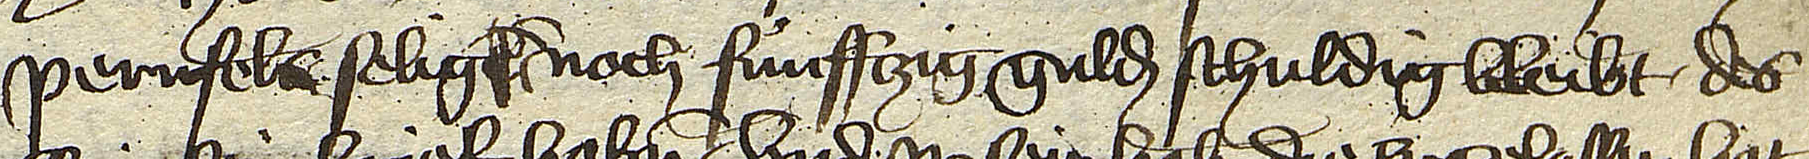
Pernfels ſelige* noch fünffcʒig guld* ſchuldig bleibt / des
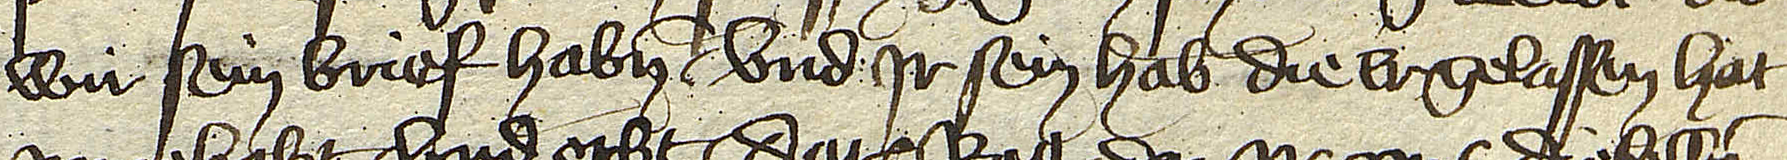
wir ſein brief habn* / vnd Ir ſein hab die Er gelaſſen hat
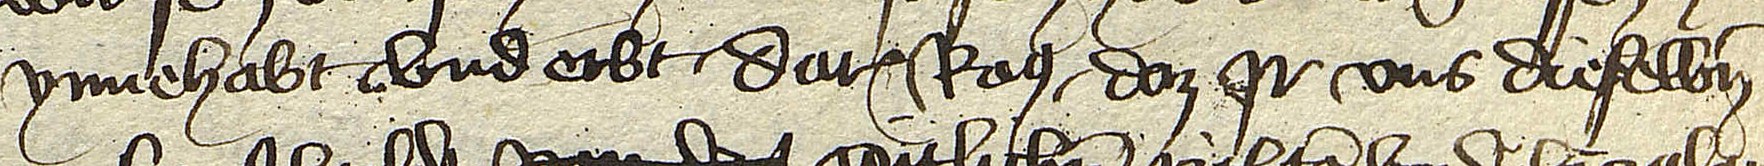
ynnehabt / vnd erbt / dar* Ro* / daʒ Ir vns dieſelbn*
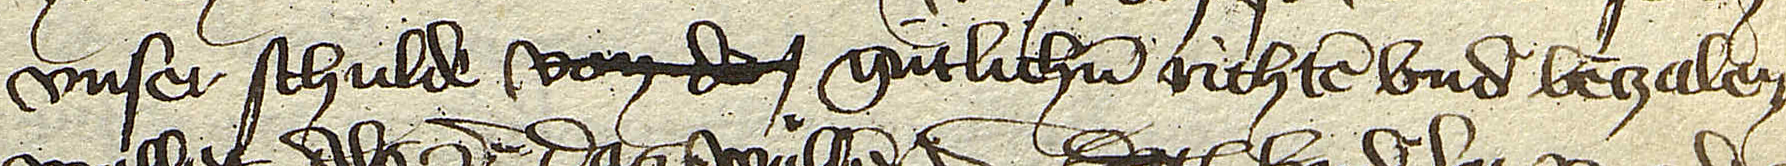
vnſer ſchulde von de gütlichn* richte* vnd becʒalen
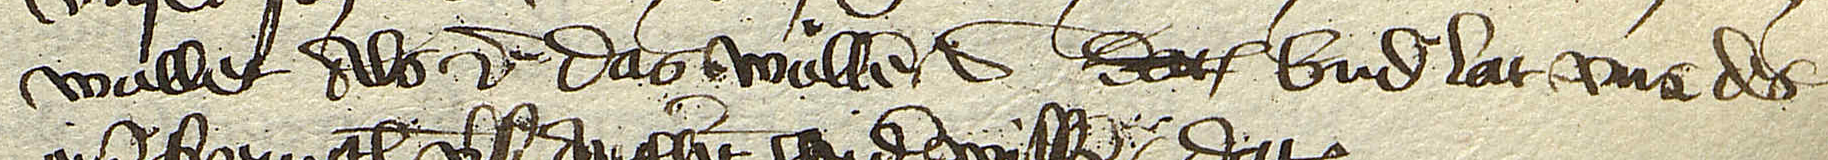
wollet Als ec* das wölle* ec* dat* vnd lat vns des
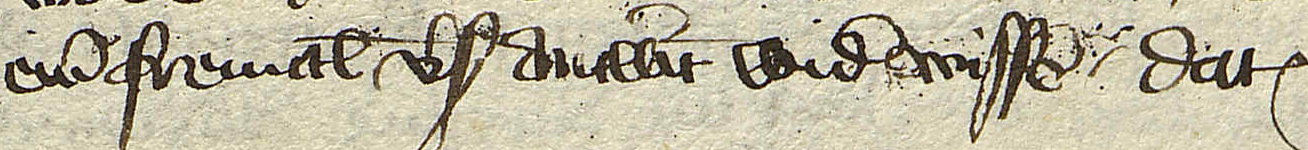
ew* freuntl* v*ſ* antwt* wid* wiſſe* / dat*
